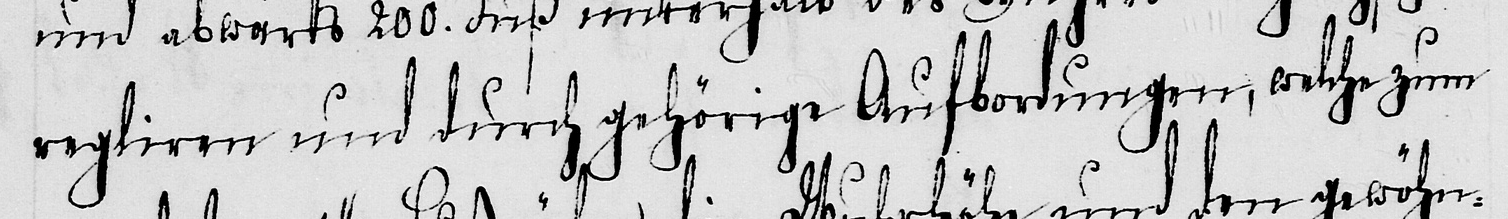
regliren und durch gehörige Aufbordungen, welche zum
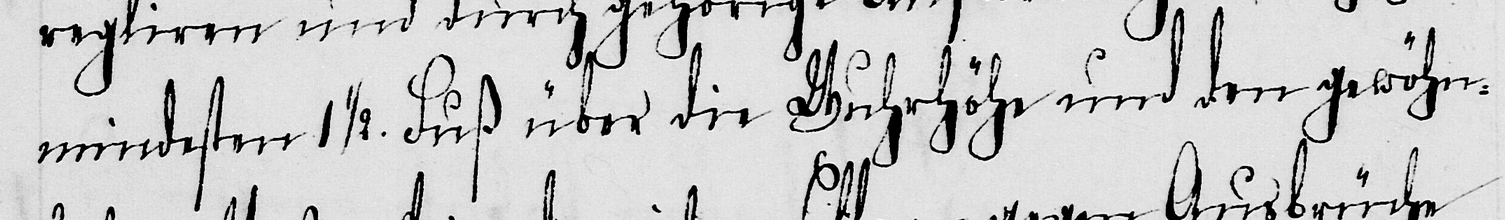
mindesten 1 1/2. Fuß über die Wuhrhöhe und den gewöhn¬
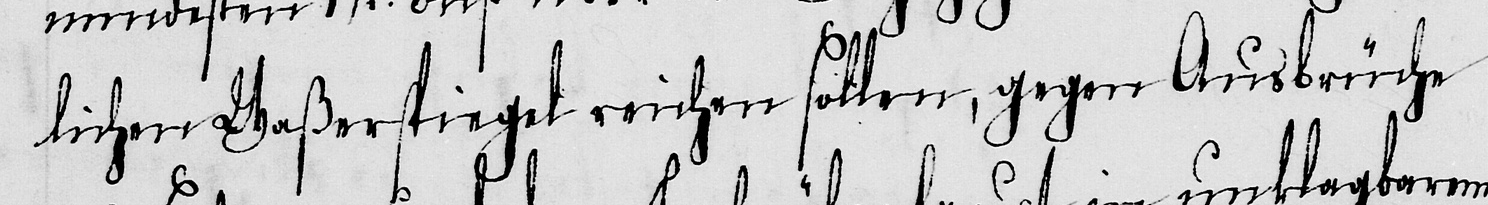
lichen Waßerspiegel reichen sollen, gegen Ausbrüche
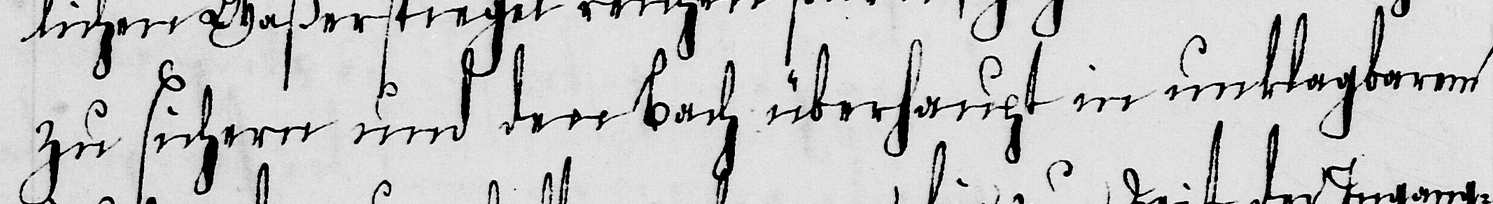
zu sichern und den Bach überhaupt in unklagbarem
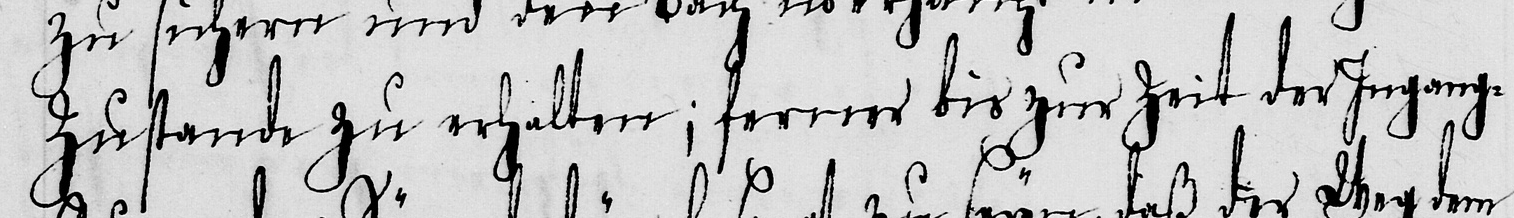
Zustande zu erhalten; ferner bis zur Zeit der Ingang¬
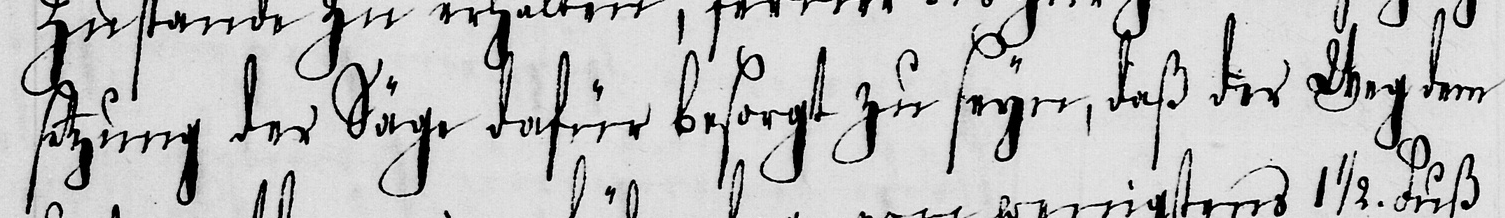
setzung der Säge dafür besorgt zu seyn, daß der Weg dem
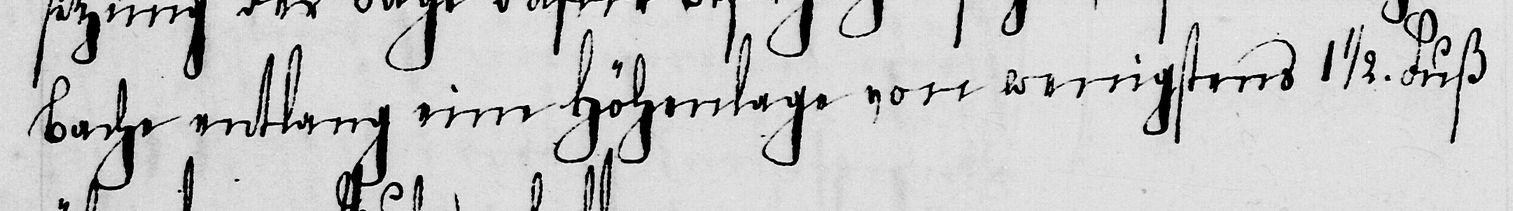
Bache entlang eine Höhenlage von wenigstens 1 1/2. Fuß
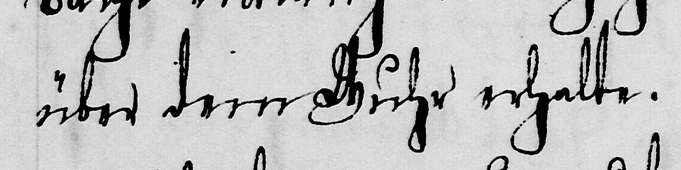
über dem Wuhr erhalte.
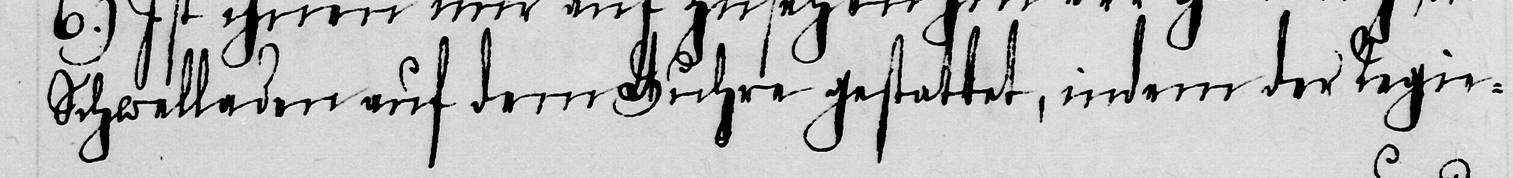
Schwelladen auf dem Wuhre gestattet, indem der Regie-
